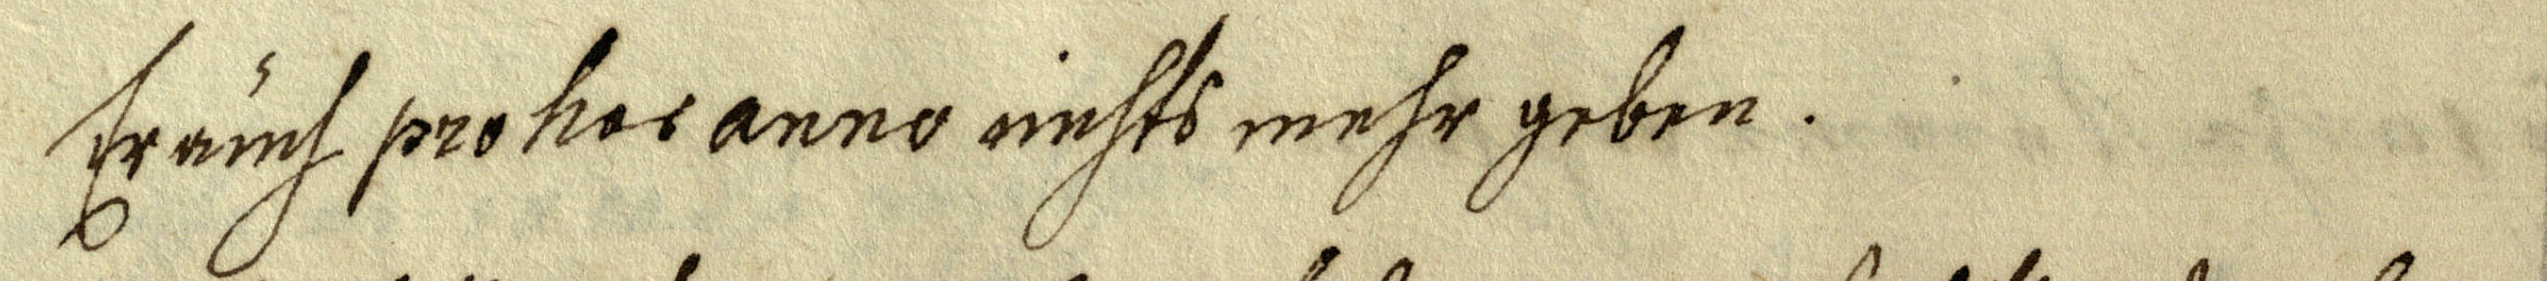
Er auch pro hoc anno nichts mehr geben.
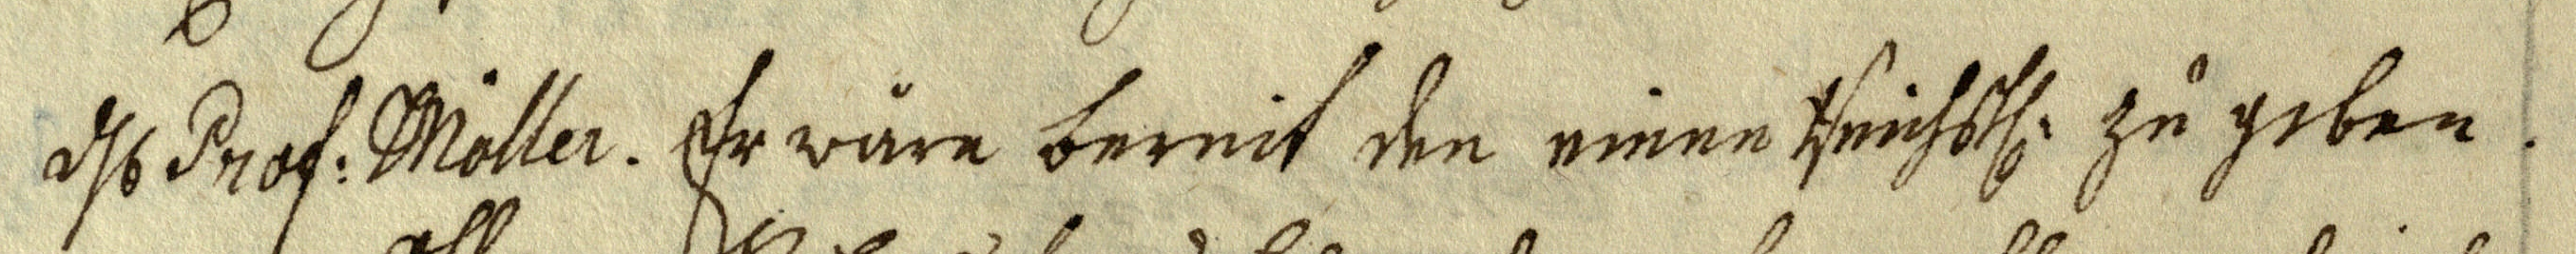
dh Prof: Möller. Er wäre bereit, den einen Reichst. zu geben.
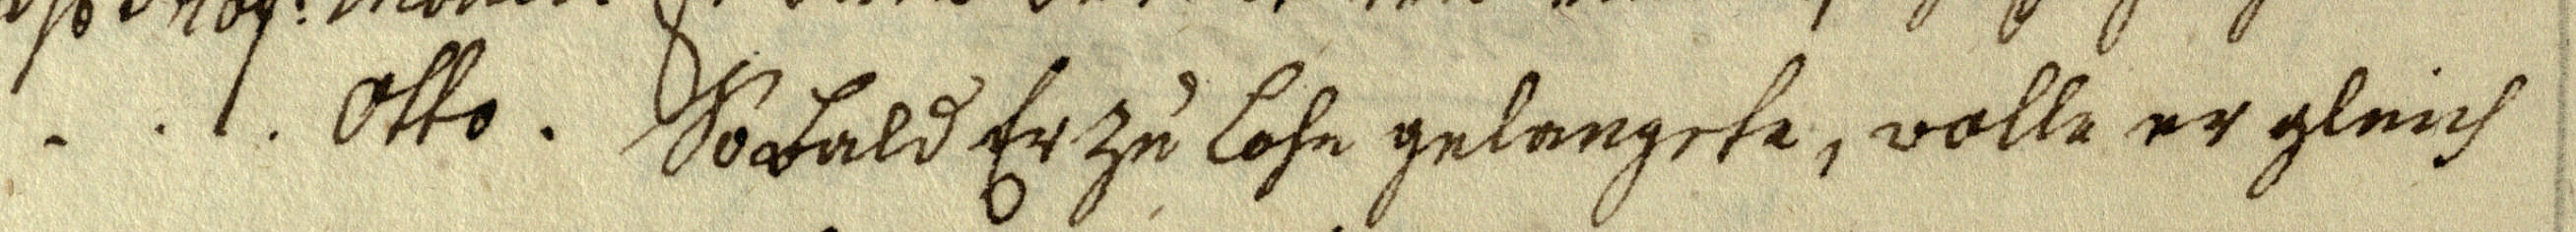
Otto. So bald Er zu Lohn gelangete, wolle er gleich
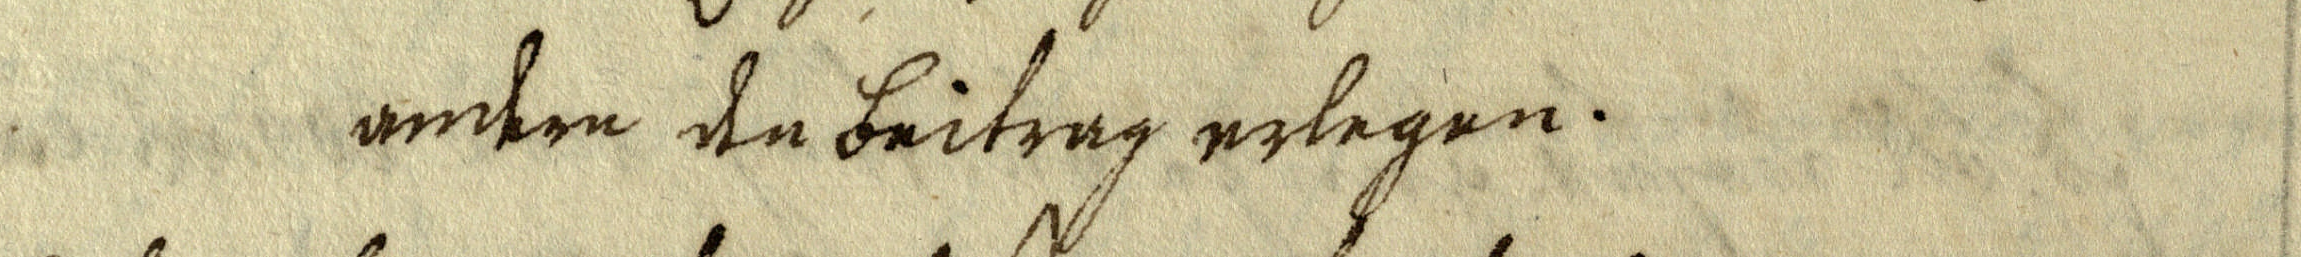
andern den Beitrag erlegen.
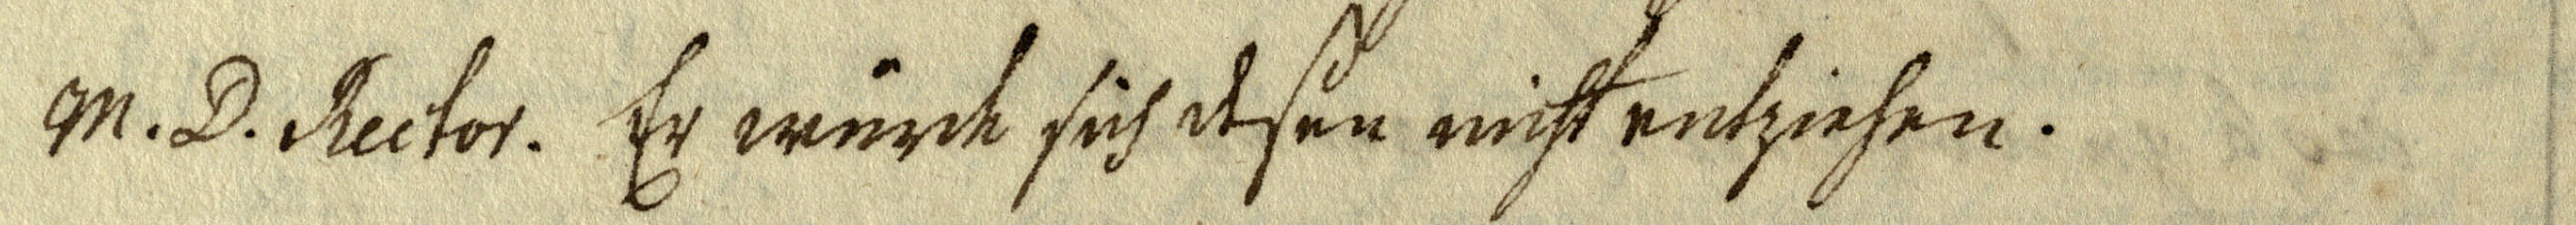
M. D. Rector. Er würde sich deßen nicht entziehen.
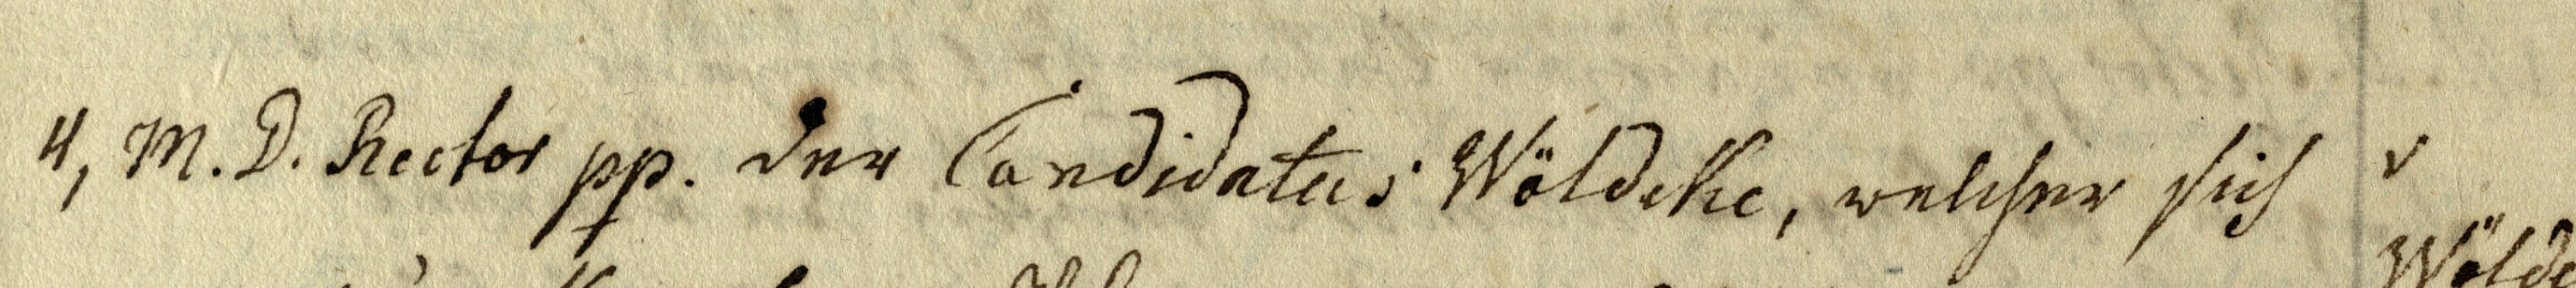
4. M. D. Rector pp. der Candidatus Wöldeke, welcher sich
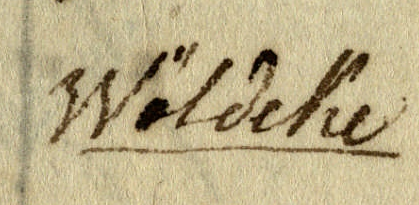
Wöldeke
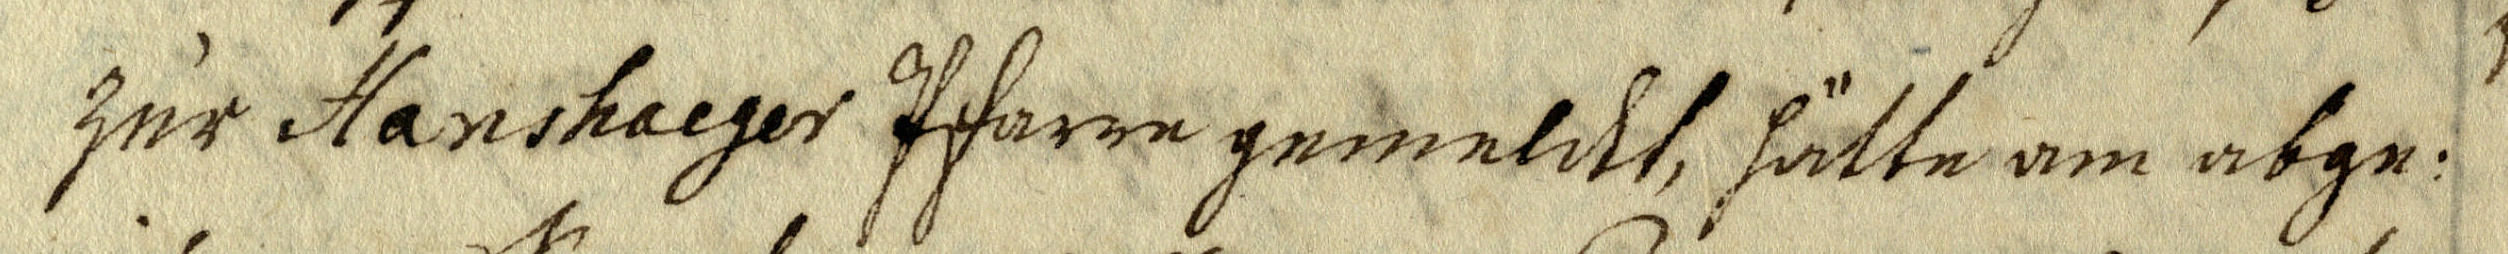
zur Hanshaeger Pfarre gemeldet, hätte am abge¬
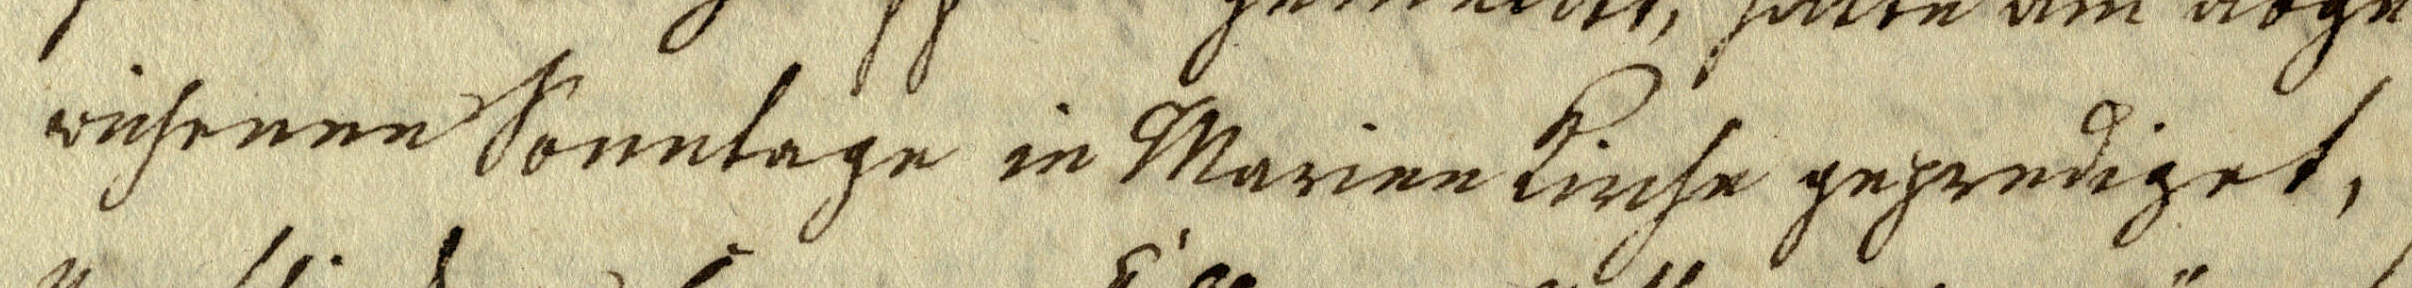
wichenen Sonntage in Marien Kirche geprediget,
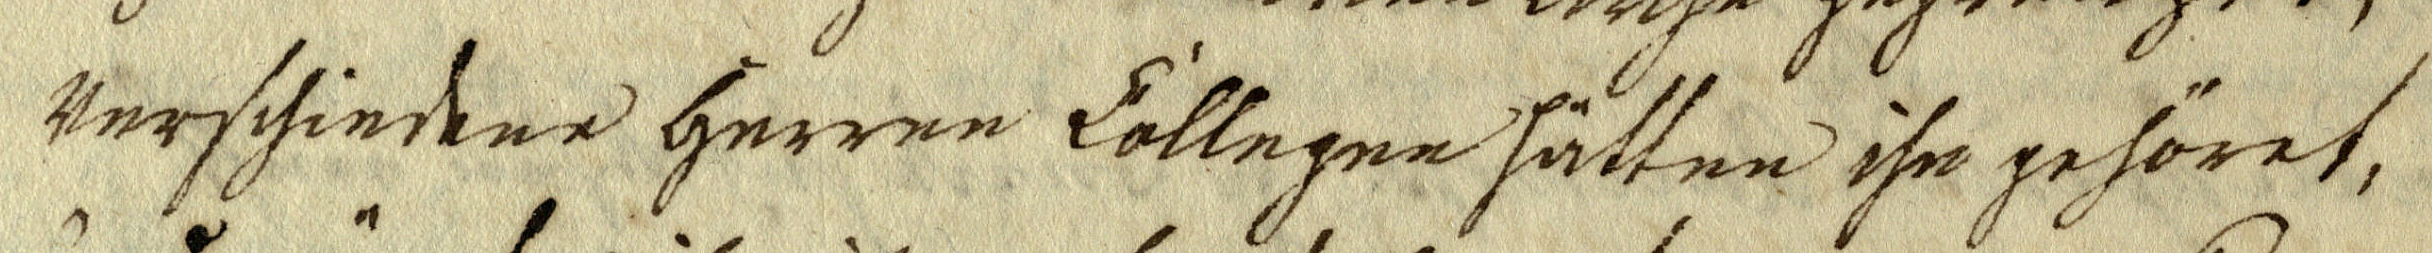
verschiedenen Herren Collegen hätten ihn gehöret,
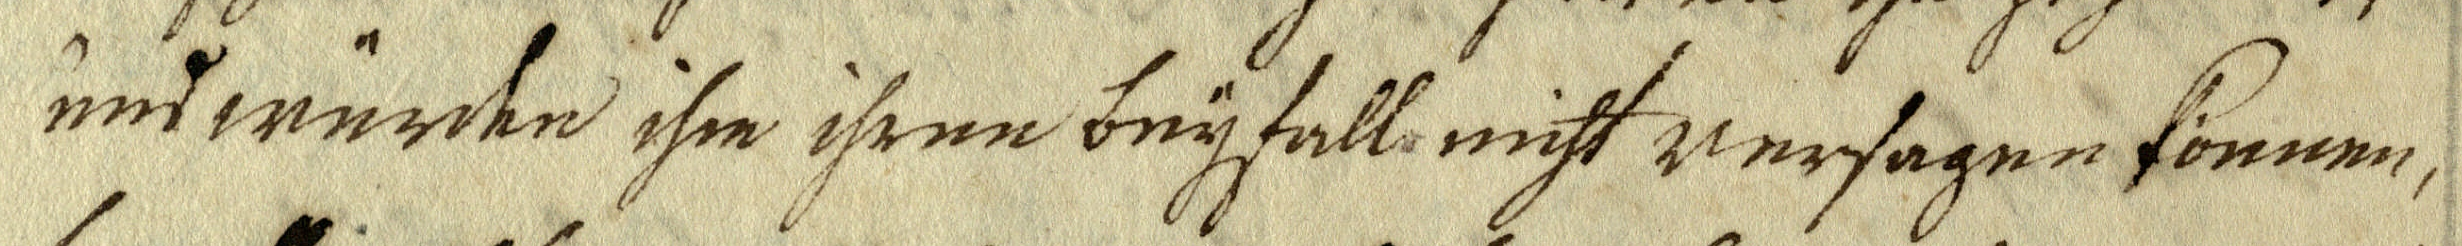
und würden ihm ihren Beÿfall nicht versagen können,
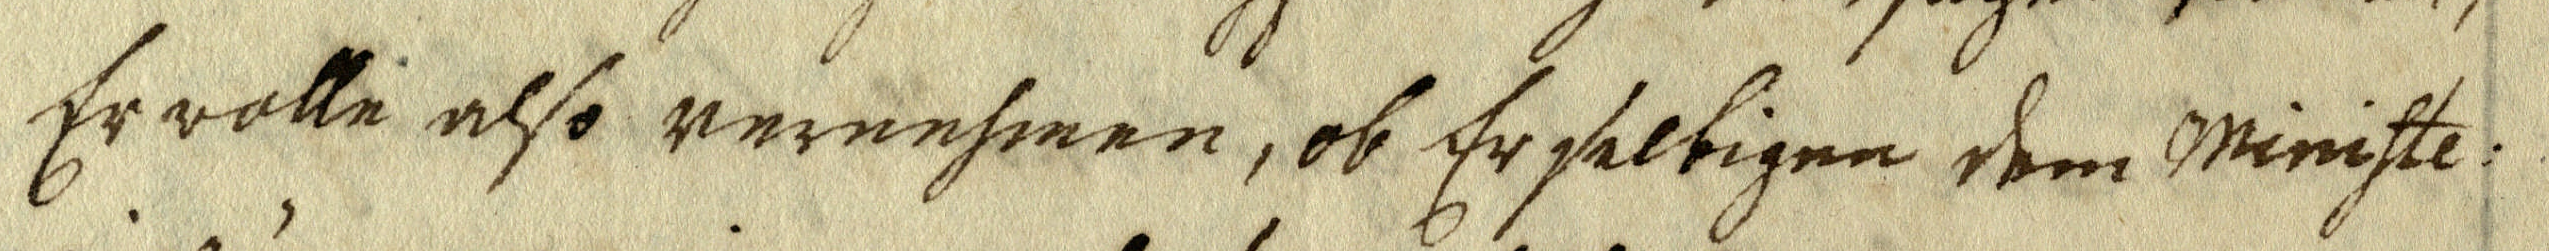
Er wolle also vernehmen, ob Er selbigen dem Ministe¬
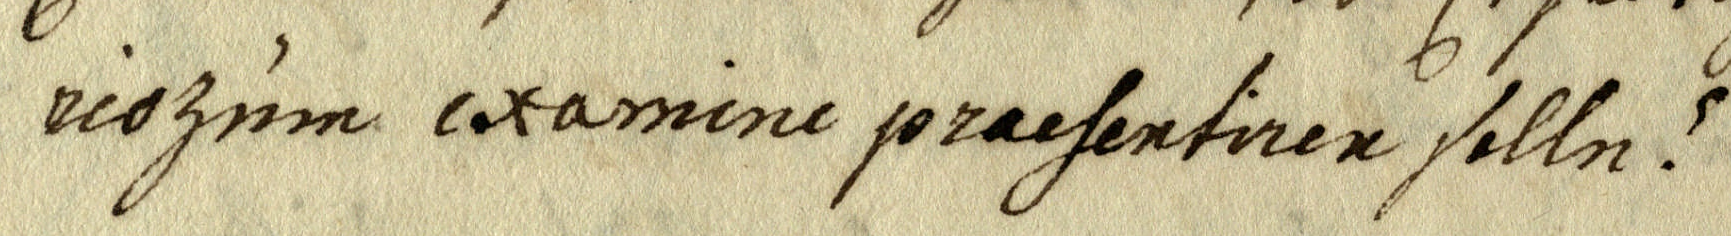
rio zum examine praesentiren solle!
